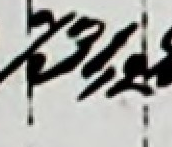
731,2
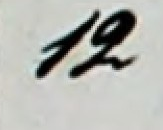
12
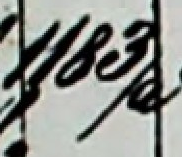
1183/a
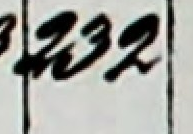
232
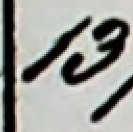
13
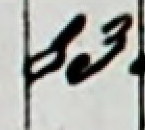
13
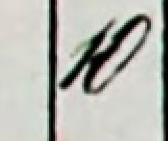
10
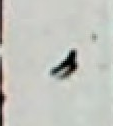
„
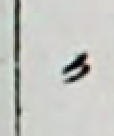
„
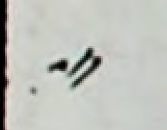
„
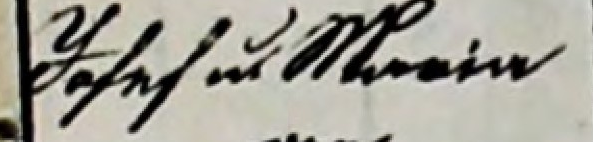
Josef u. Maria
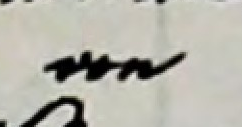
an
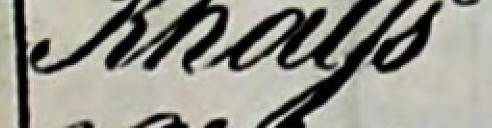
Khalss
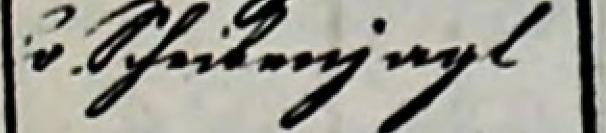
v. Scheiberjagl
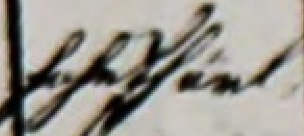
hohe Therl
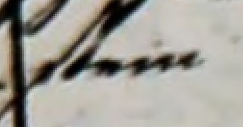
stein
